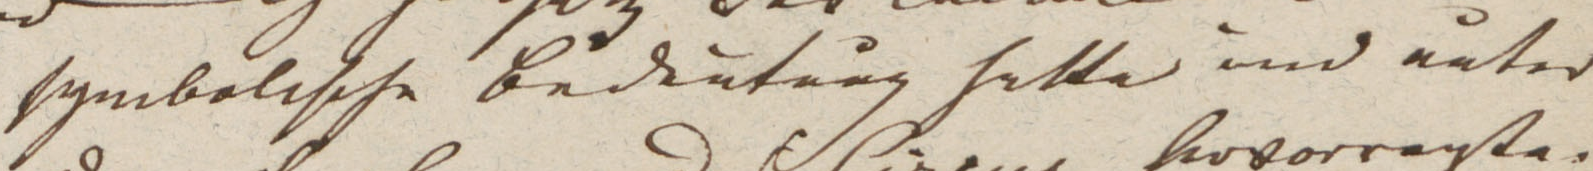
symbolische Bedeutung hatte und unter
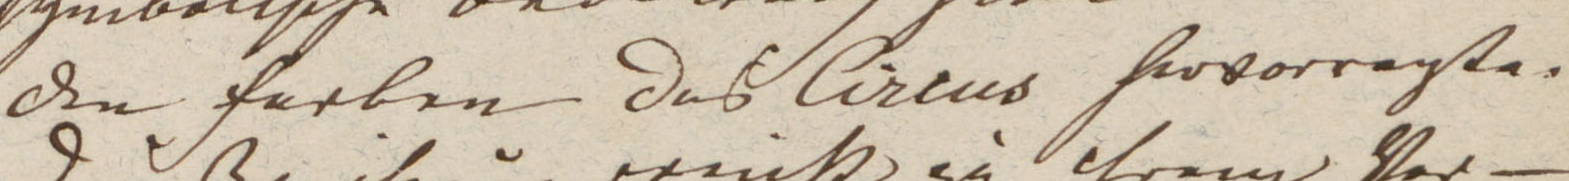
den Farben des Circus hervorragte.
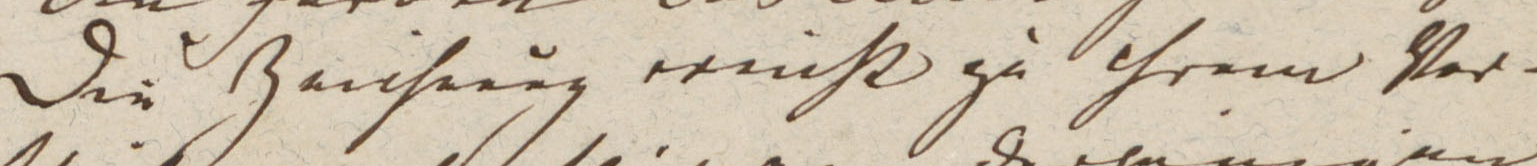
Die Zeichnung weicht zu ihrem Vor-
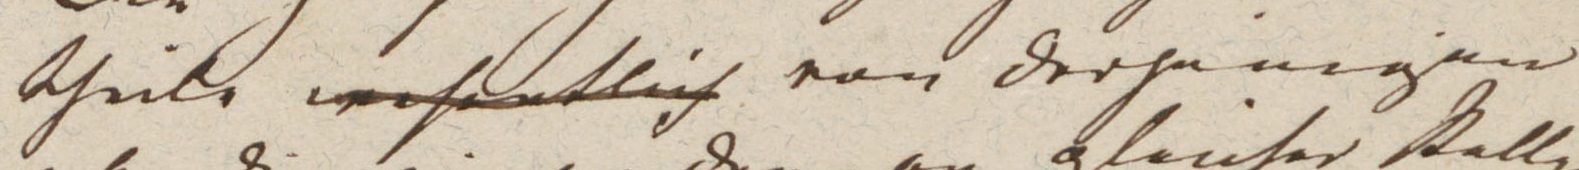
theile wesentlich von derjenigen
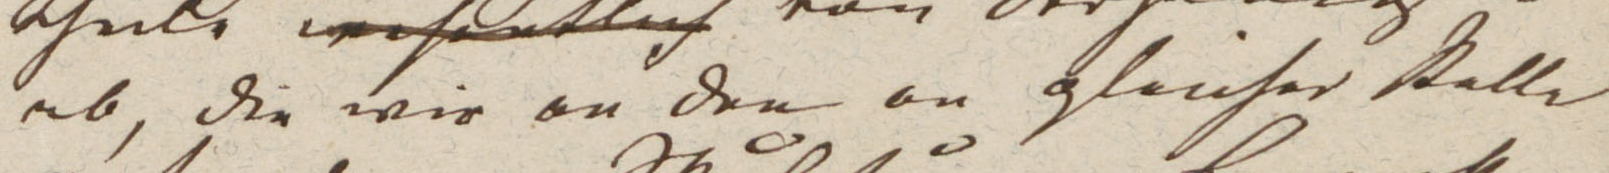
ab, die wir an den an gleicher Stelle
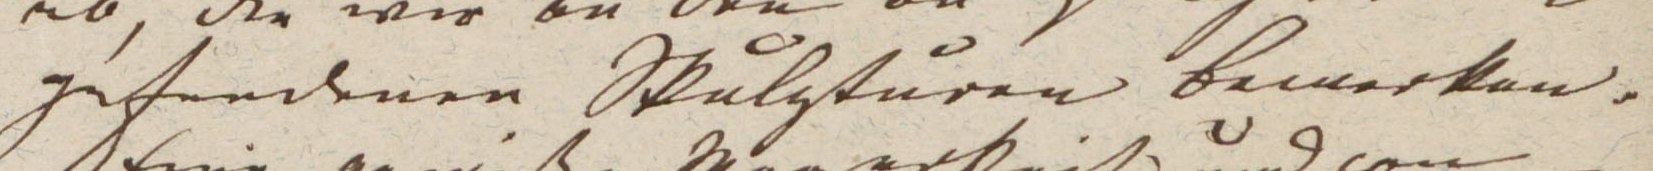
gefundenen Skulpturen bemerken.
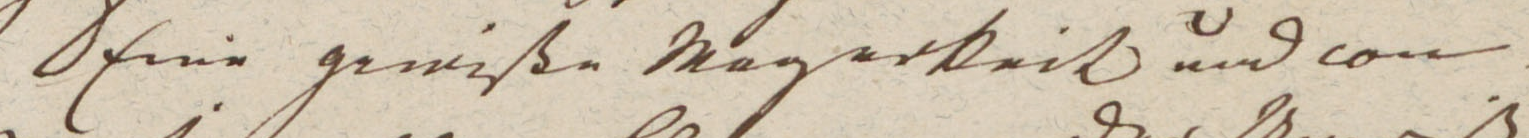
Eine gewisse Magerkeit und con-
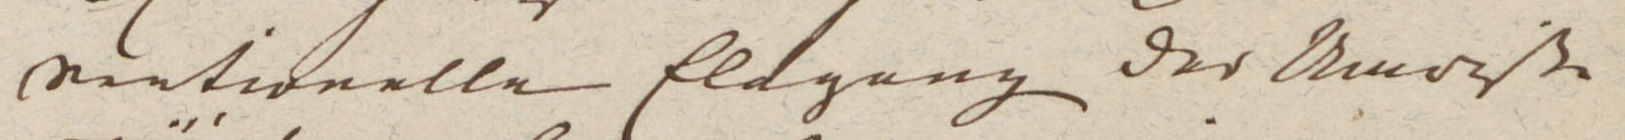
ventionelle Eleganz der Umrisse
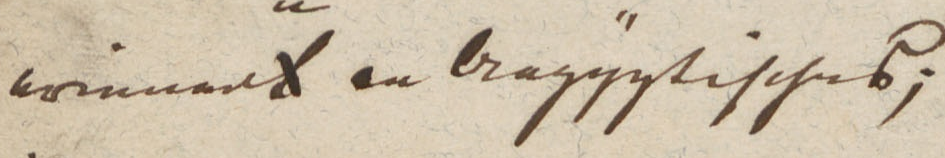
erinnertn an Aegyptisches;
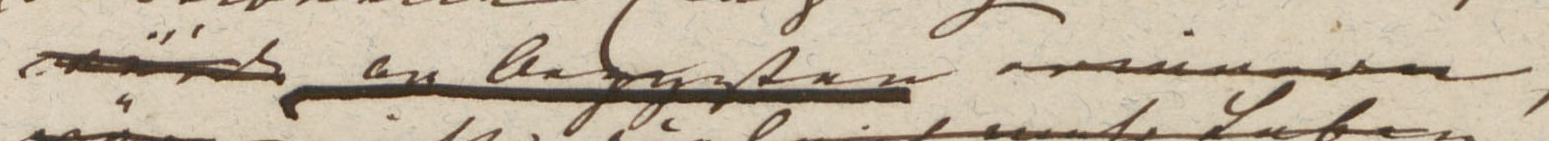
würde an Aegypten erinnern,
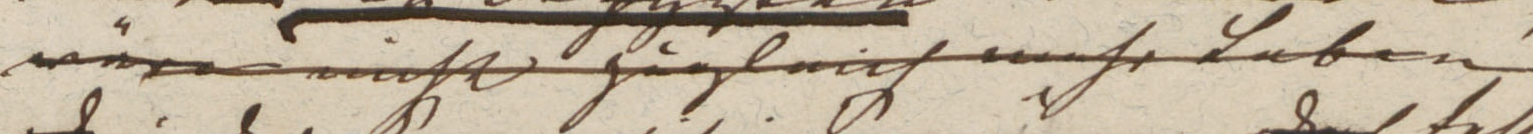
wäre nicht zugleich mehr Leben
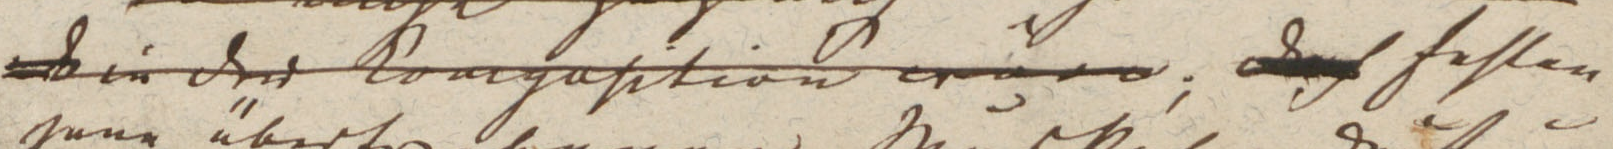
es in der Composition wäre; Doch fehlen
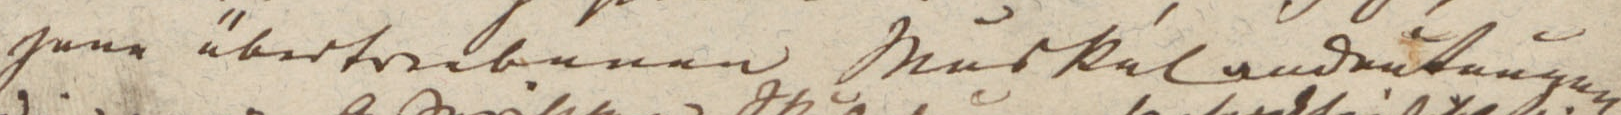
jene übertriebenen andeutungen
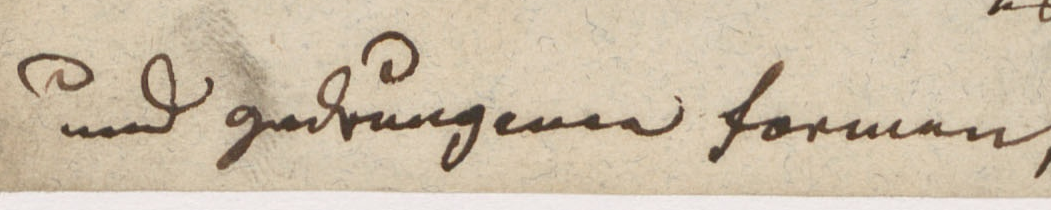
und gedrungenen Formen,
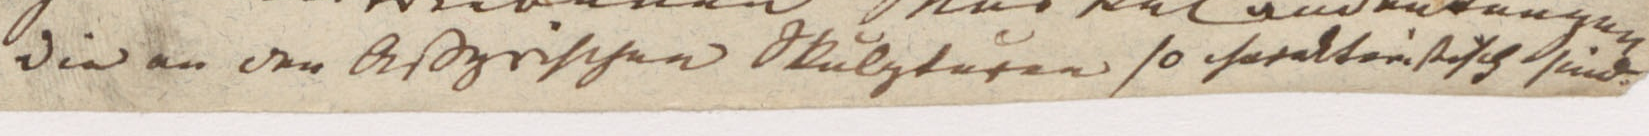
die an den Assyrischen Skulpturen so charakteristisch sind.
